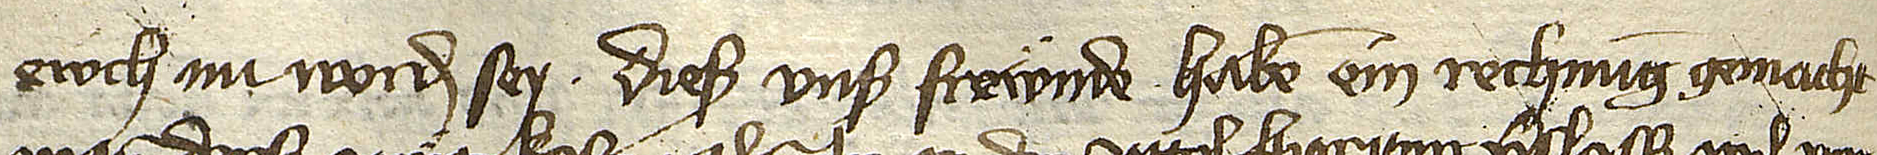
ewch nu word* ſey . Dieſ* vnſ* freẅnde habe* ein rechnug* gemacht
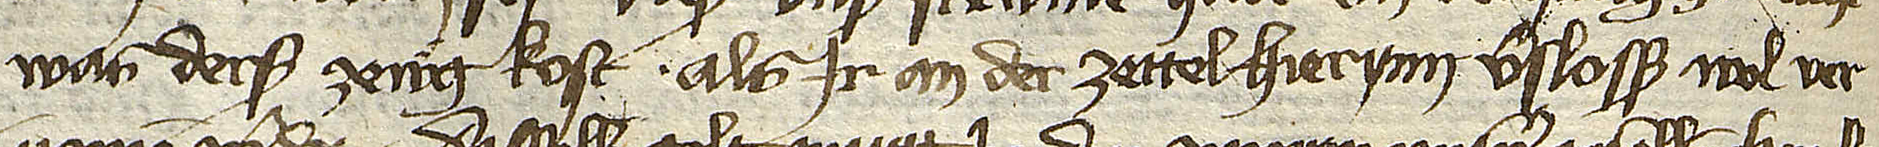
was derſ* ʒeẅg koſt . als Ir an der ʒettel hierynn v*ſloſſ* wol ver
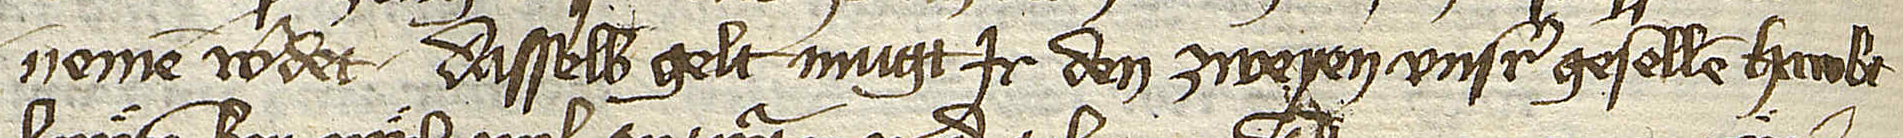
neme* w*det / Daſſelb gelt mugt Ir den ʒweyen vnſr* geſelle* hawbt
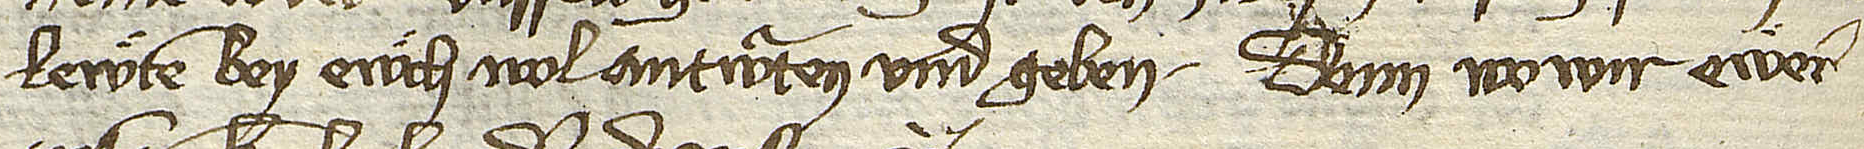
leẅte* bey eẅch wol antwten* vnd geben / Denn wo wir eẅer*
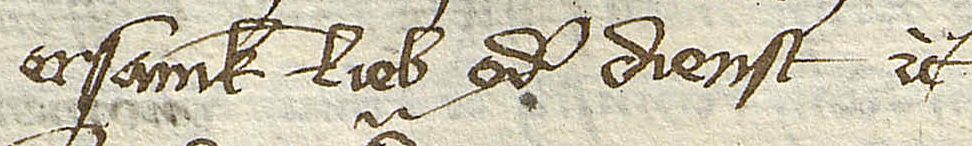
erſamk* lieb od* dienſt ec*
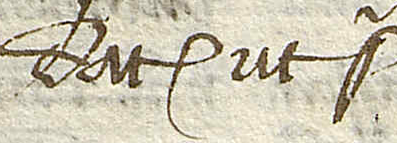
Dat* ut ſ*
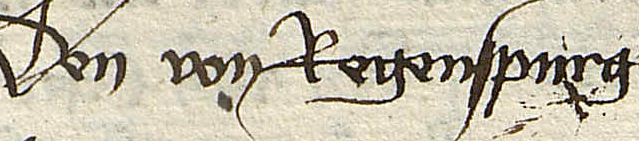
Den von Regenſpurg
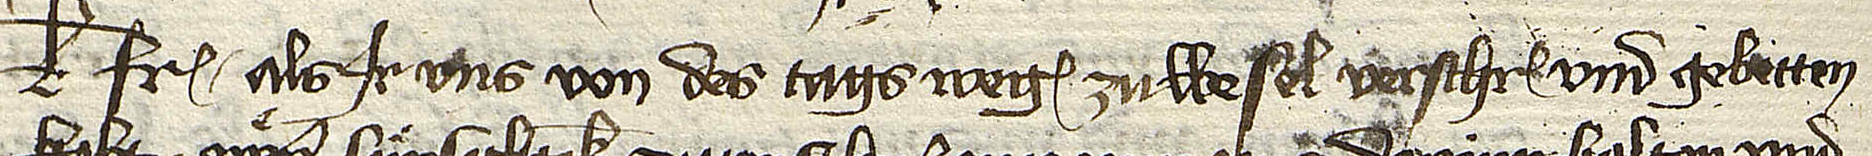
L* fr* / als Ir vns von des tags weg* ʒu weſel verſchr* vnd gebetten
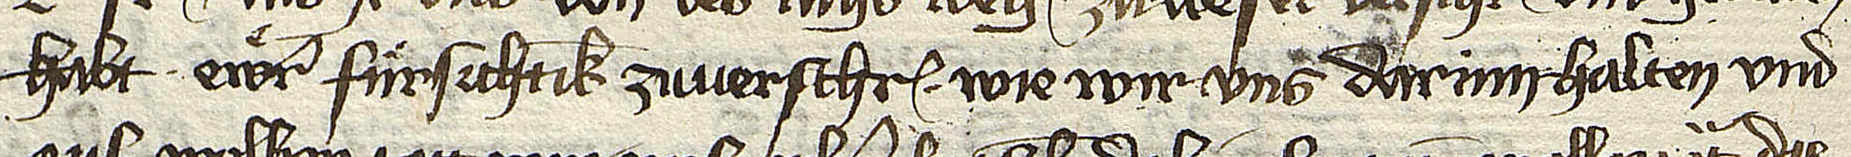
habt eẅr* fürſichtik* ʒuuerſchr* wie wir vns darinn halten vnd
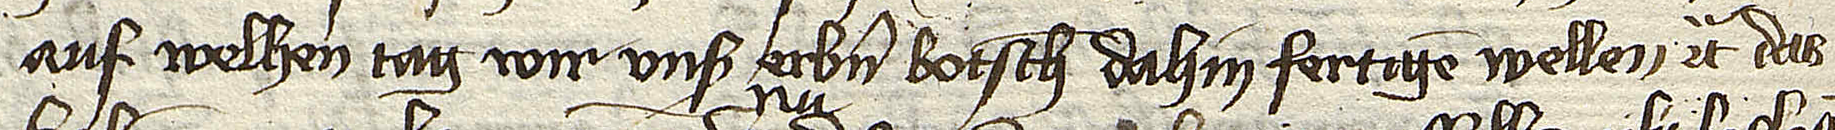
auf welhen tag wir vnſ* erbn* botſch* dahin fertige* wellen ec* das
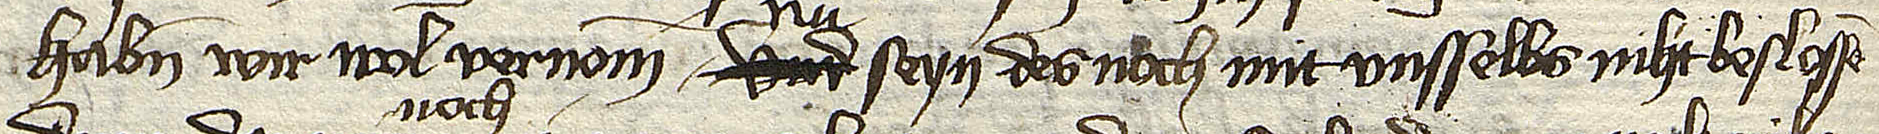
habn* wir wol vernom* / Vnd ſeyn des noch mit vnſſelbs niht beſloſſe*
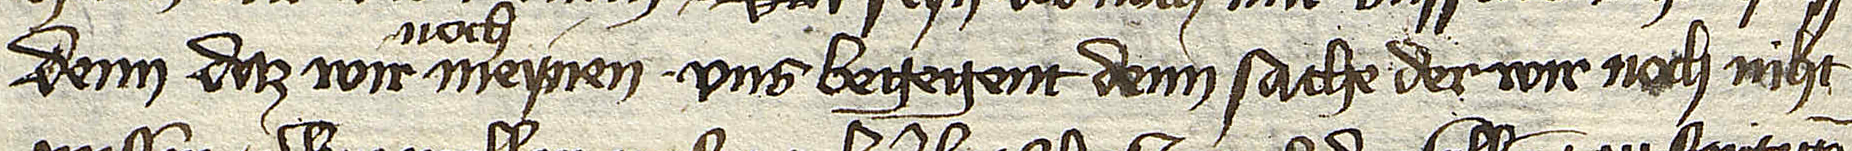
denn daʒ wir meynen . vns begegent denn ſache der wir noch niht
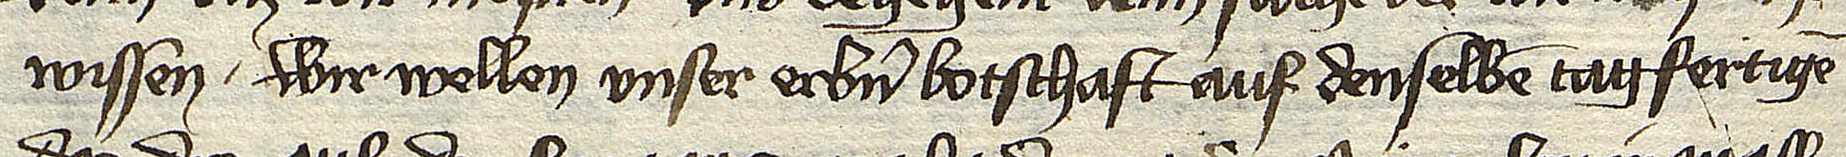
wiſſen / wir wellen vnſer erbn* botſchaft auf denſelbe* tag fertige*
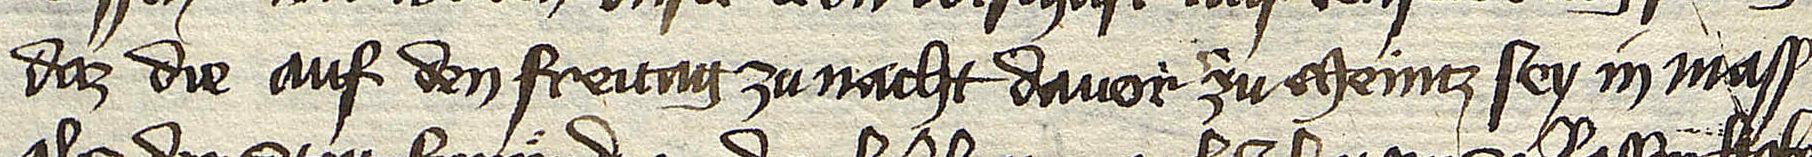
daʒ die auf den freitag ʒu nacht dauor ʒu Meincʒ ſey in maſſ
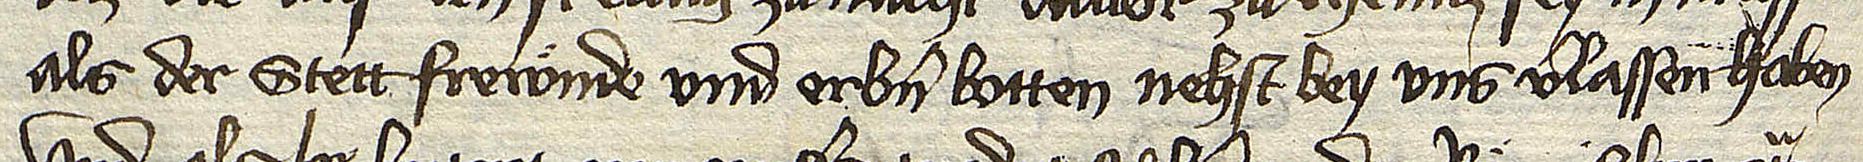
als der Stett freẅnde vnd erbn* botten nehſt bey vns v*laſſen haben
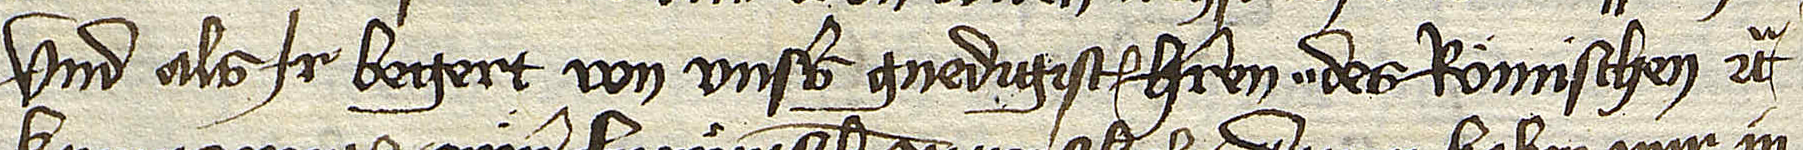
Vnd als Ir begert von vnſs* gnedigiſt* hr*en ~ des Römiſchen ec*
